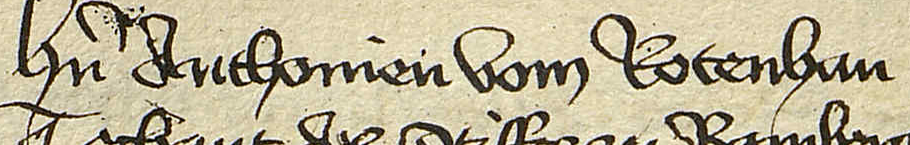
hn* Anthonien von Rotenhan
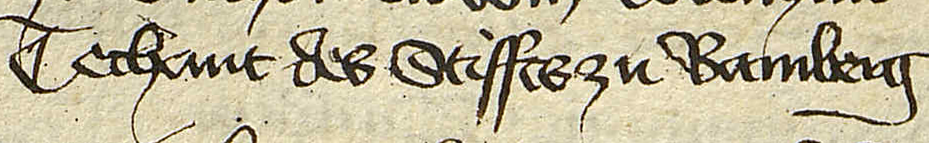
Techant des Stiffts cʒu Bamberg
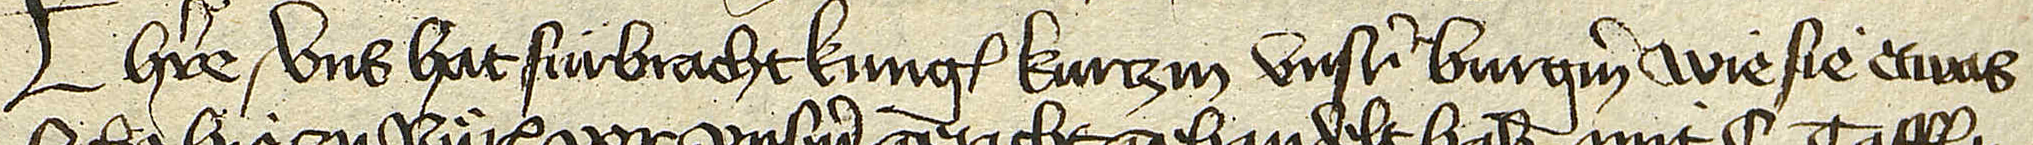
L* h*re / vns hat fürbracht kung* kurcʒin vnſr* burg*in wie ſie etwas
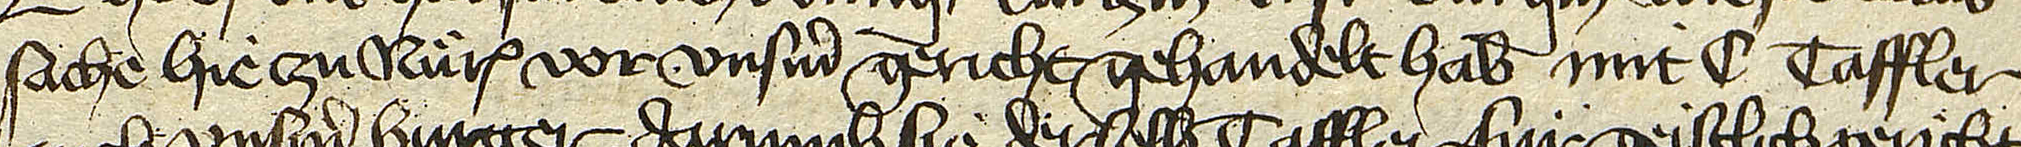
ſache hie cʒu Nür* vor vnſm* gericht gehandelt hab mit C Taffler
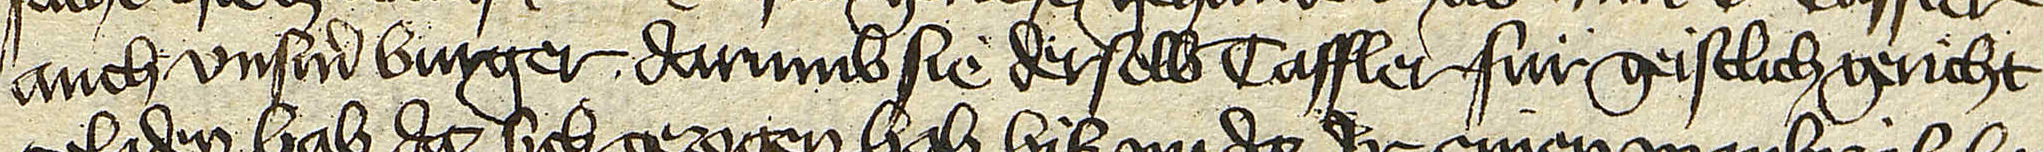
auch vnſm* burger darumb ſie derſelb Taffler für geiſtlich gericht
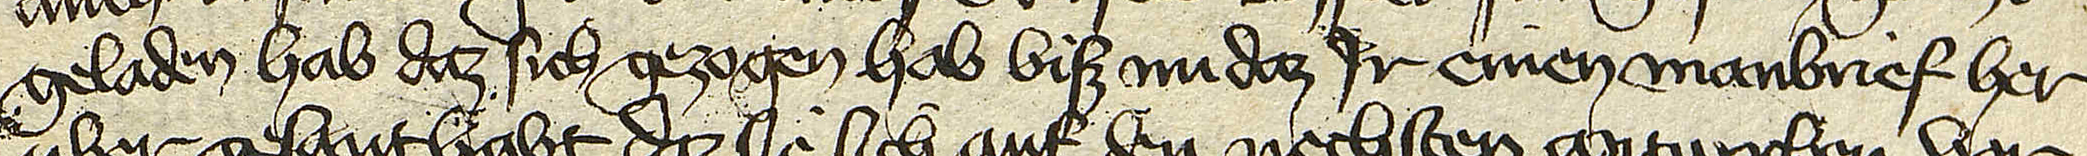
geladen hab daʒ ſich geʒogen hab biſʒ nu daʒ Ir einen manbrief her
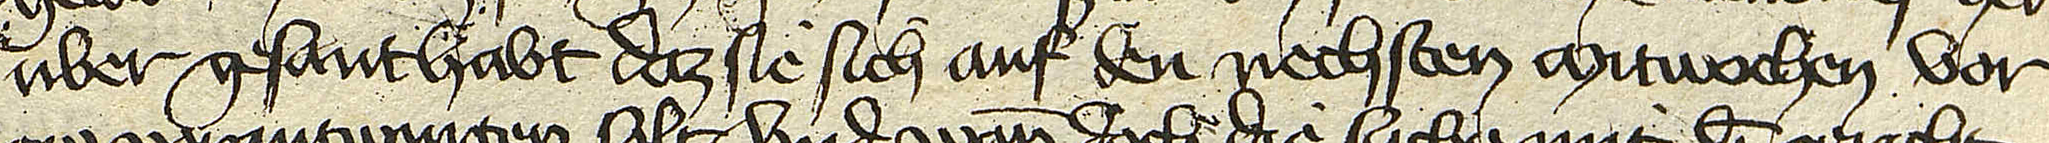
uber geſant habt daʒ ſie ſich auf den nechſten Mitwochen vor
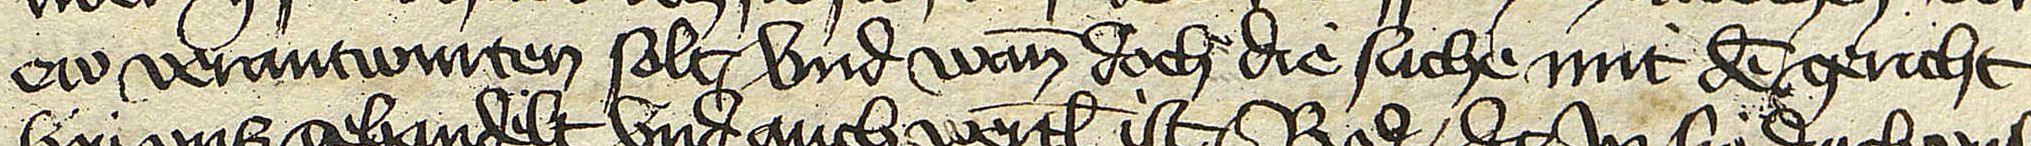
ew verantwurten ſolt / vnd wan* doch die ſache mit de* gericht
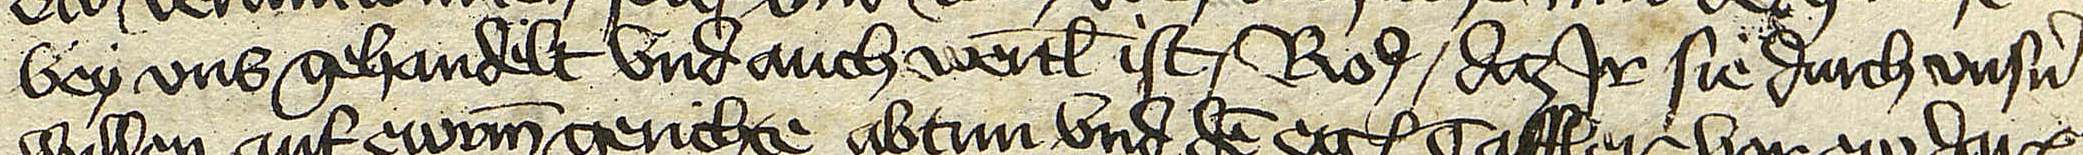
bey vns gehandelt vnd auch wertl* iſt / Ro* / daʒ Ir ſie durch vnſn*
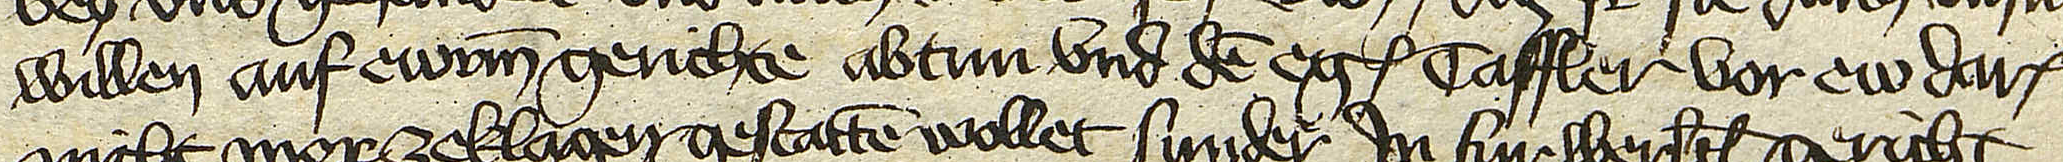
willen auf ewrm* gerichte abtun vnd de* eg* Taffler vor ew dar*
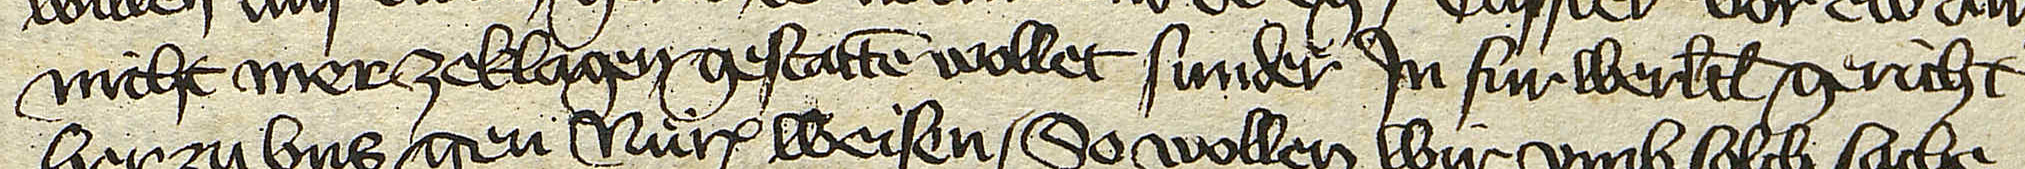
nicht mer cʒeklagen geſtatte* wollet ſunder In für werltl* gericht
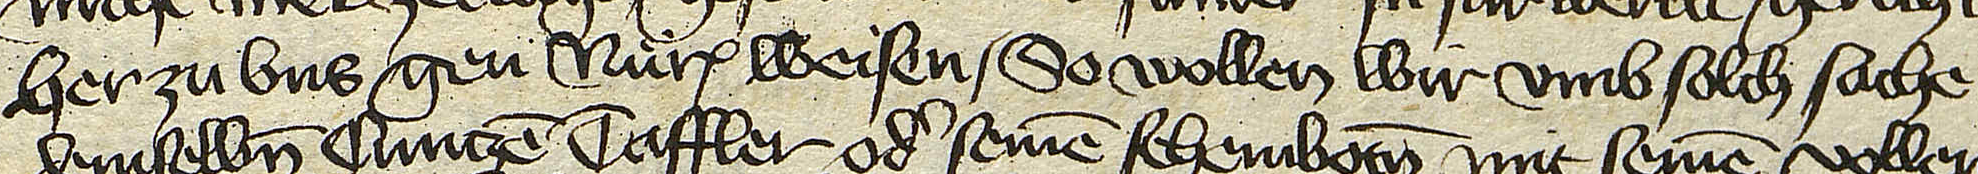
her cʒu vns gen Nür* weiſen / So wollen wir vmb ſolch ſache
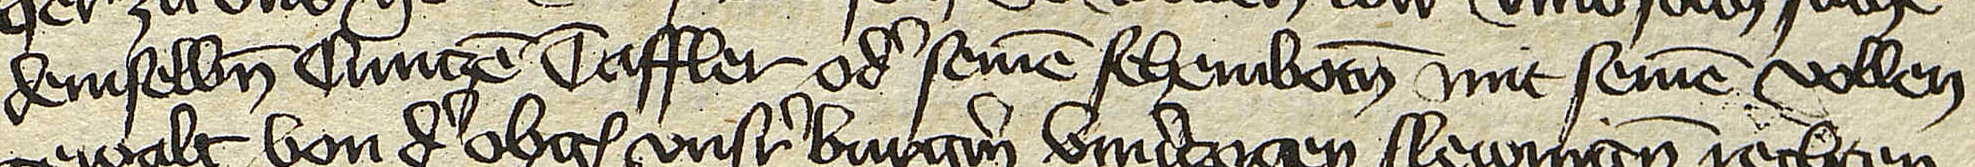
demſelbn* Cuncʒe* Taffler od* ſeine* ſcheinbotn* mit ſeine* vollen
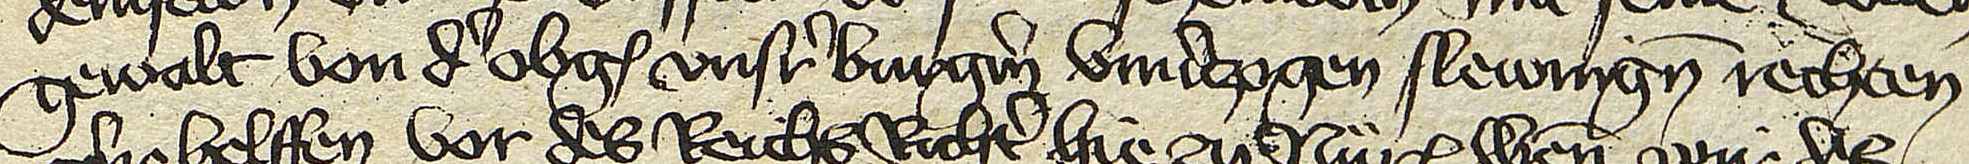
gewalt von d* obg* vnſr* burg*in vnu*cʒogen ſlewnign* rechten
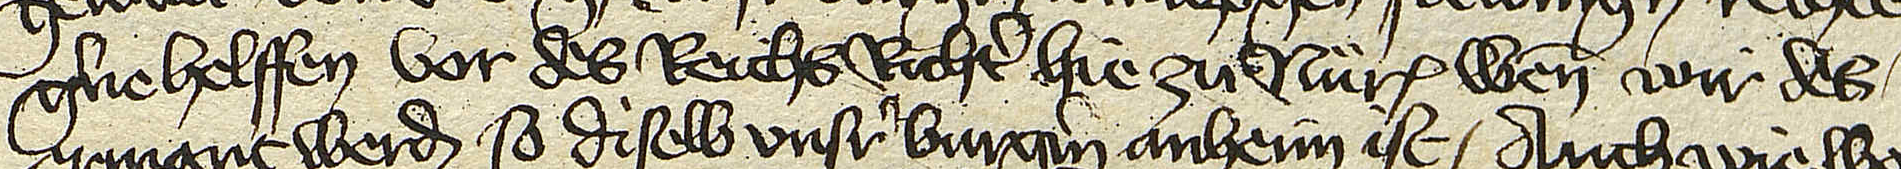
g*ne helffen vor des Reichs Richt* hie cʒu Nür* wen* wir des /
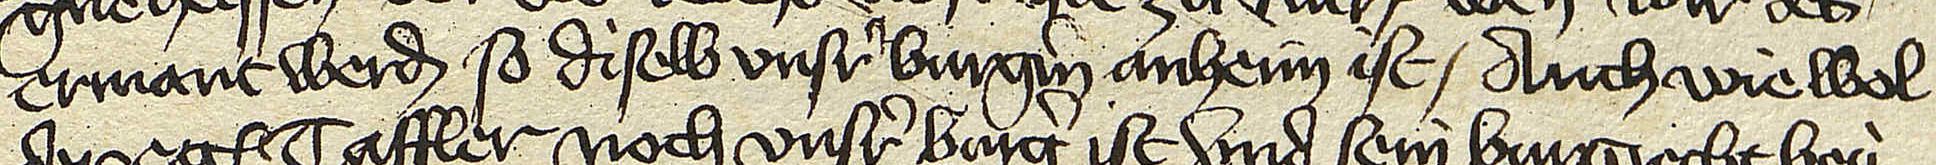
ermant werd* / ſo diſelb vnſr* burg*in anheim iſt / Auch wie wol
